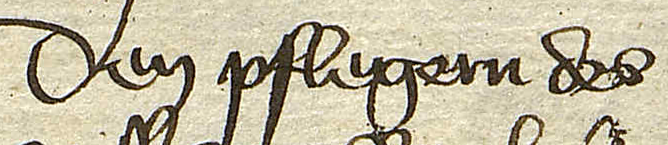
Den pflegern des
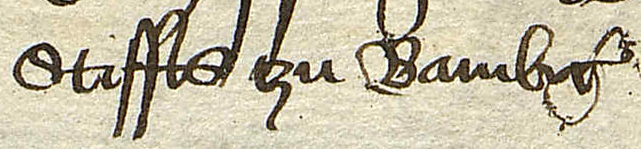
Stiffts cʒu Bamb*g
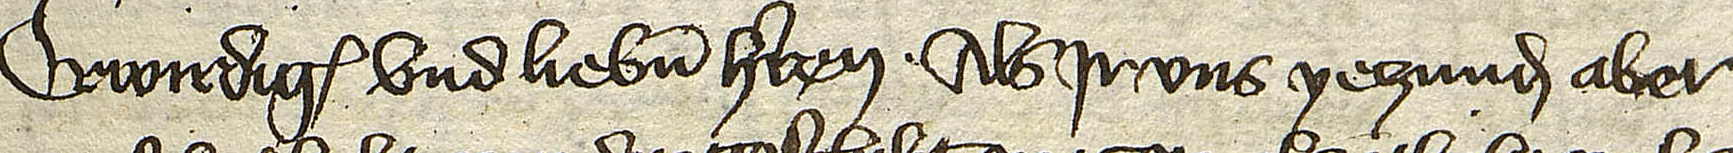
Erwirdig* vnd lieb*n h*ren . Als Ir vns yecʒund* aber
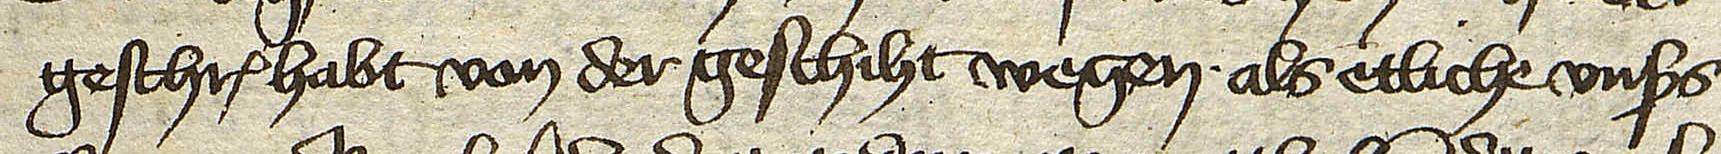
geſchr* habt von der geſchiht wegen . als etliche vnſ*s
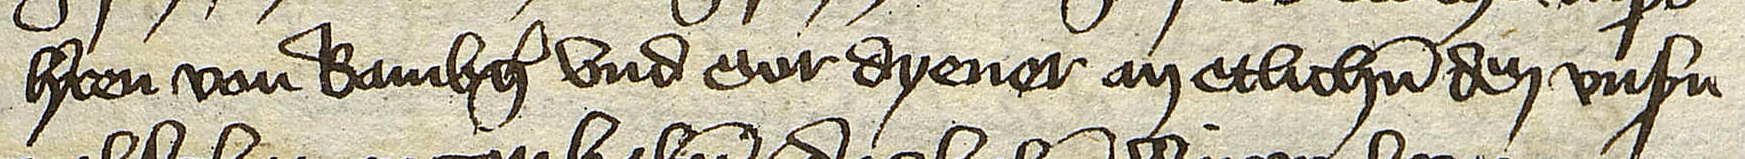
h*ren von Bamb*g vnd ewr dyener an etlich*n den vnſ*n
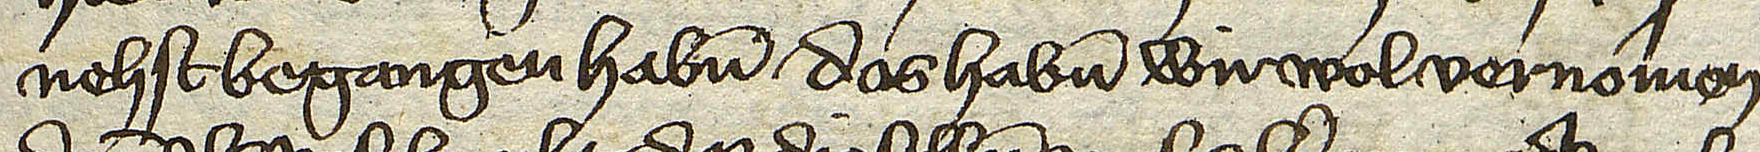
nehſt begangen hab*n / das hab* wir wol vernomen
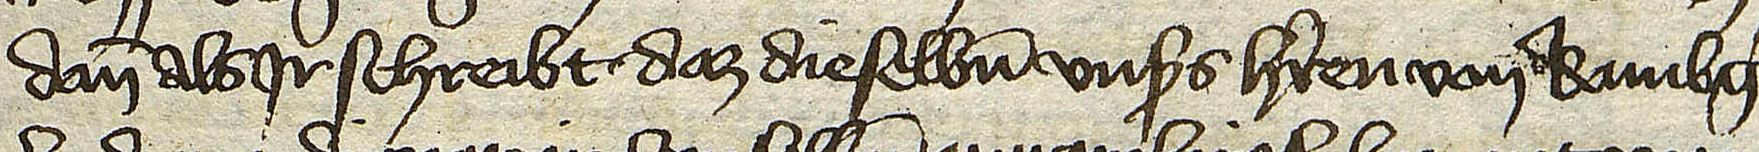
dan* Als Ir ſchreibt / daʒ dieſelb*n vnſ*s h*ren von Bamb*g
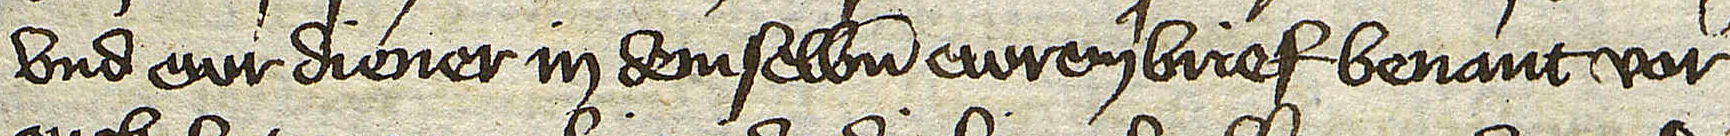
vnd ewr diener in demſelb*n ewrem brief benant vor
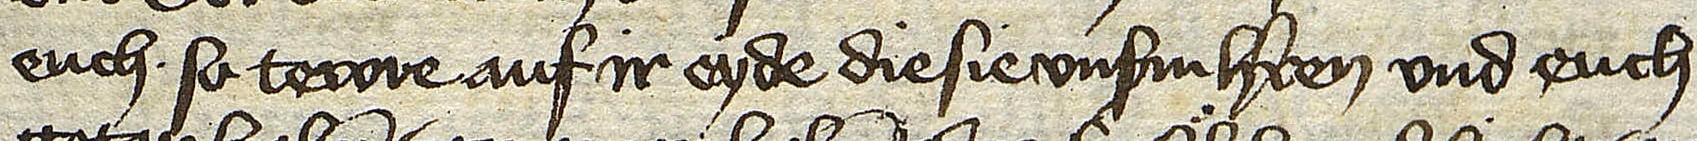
eucht . ſo tewre auf ir eyde die ſie vnſ*m h*ren vnd euch
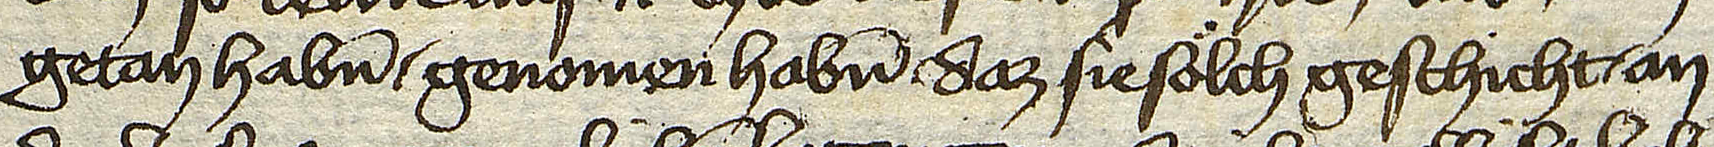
getan hab*n / genomen hab*n daʒ ſie ſölch geſchicht / an
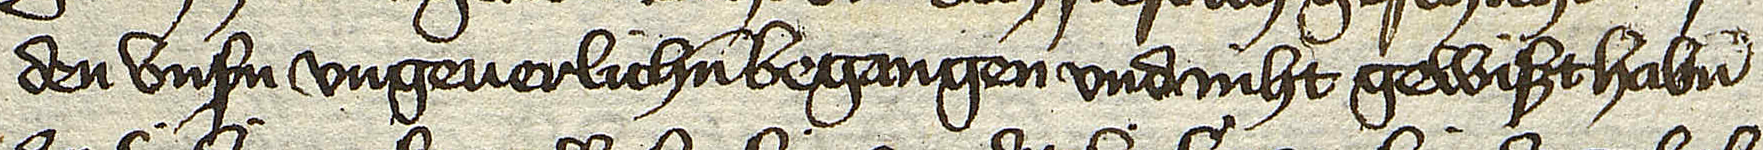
den vnſ*n vngeuerlich*n begangen vnd niht gewiſʒt hab*n
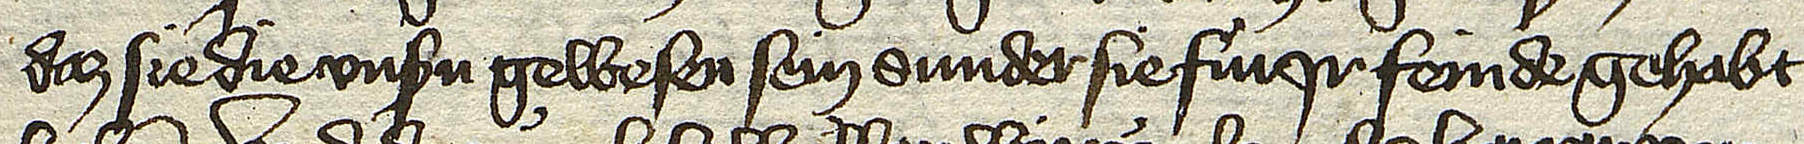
daʒ ſie die vnſ*n geweſen ſein Sunder ſie für Ir feinde gehabt
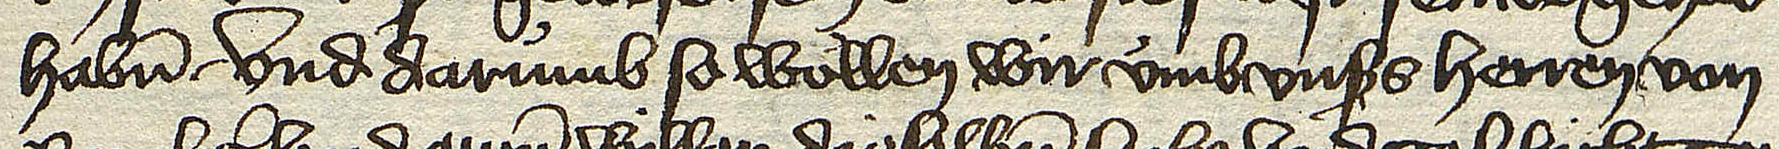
hab*n . Vnd darümb ſo wöllen wir v̈mb vnſ*s herren von
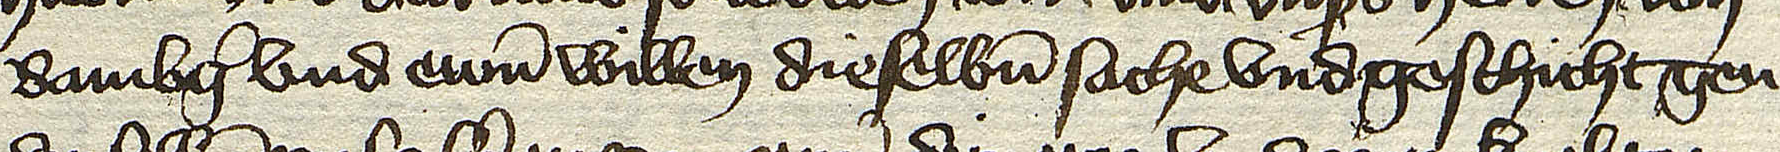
Bamb*g vnd ewn* willen dieſelb*n ſache vnd geſchicht gen
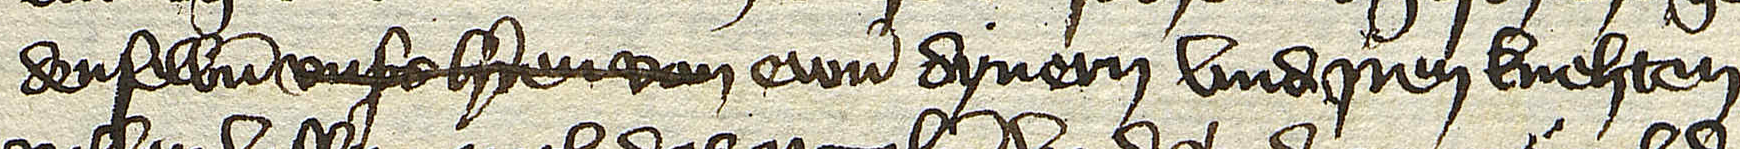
denſelb*n vnſ*s h*ren von ewn* dynern vnd Iren knehten
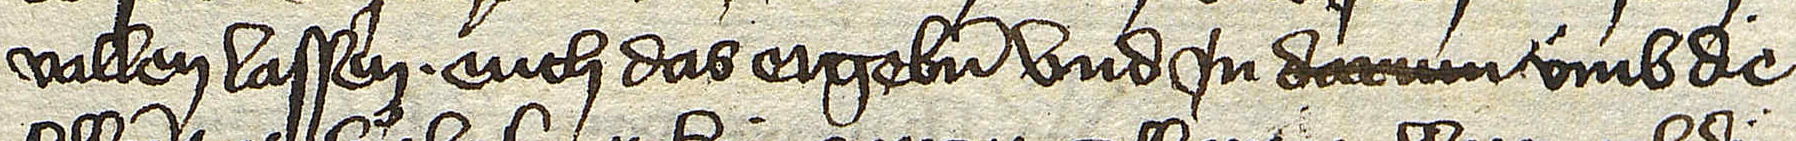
vallen laſſen . euch das ergeb*n vnd In darum v̈mb die
